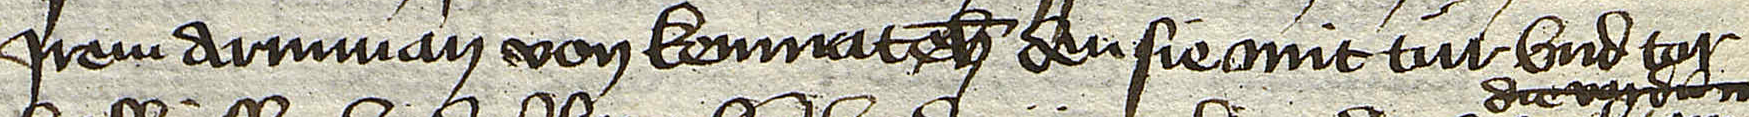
Irem Armman von kemnaten den ſie mit tür vnd tor
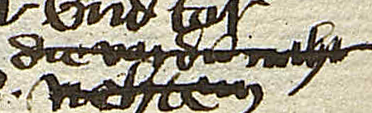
die vordn* niht
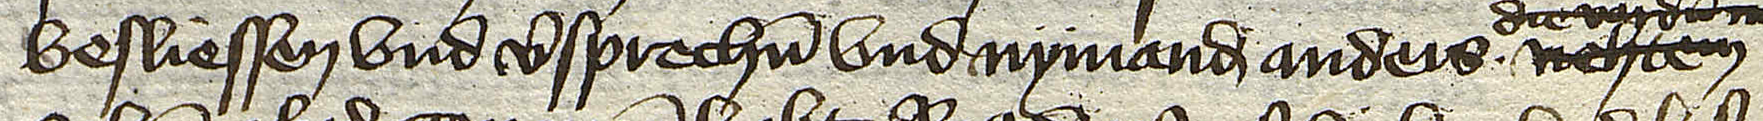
beſlieſſen vnd v*ſprech*n vnd nymand* anders . nehtein
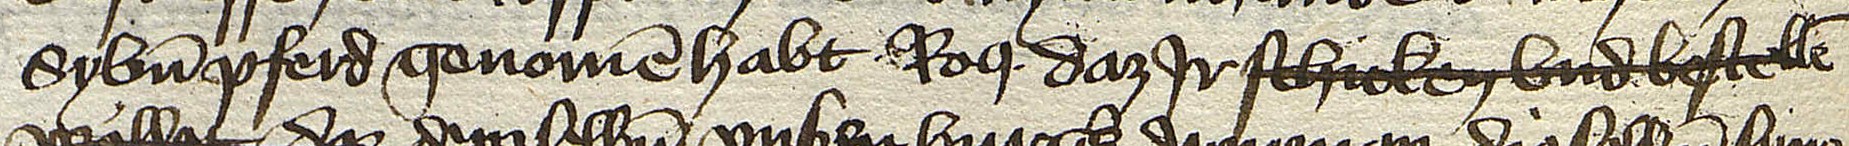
Syb*n pferd genome* habt Ro* daʒ Ir ſchicken vnd beſtelle*
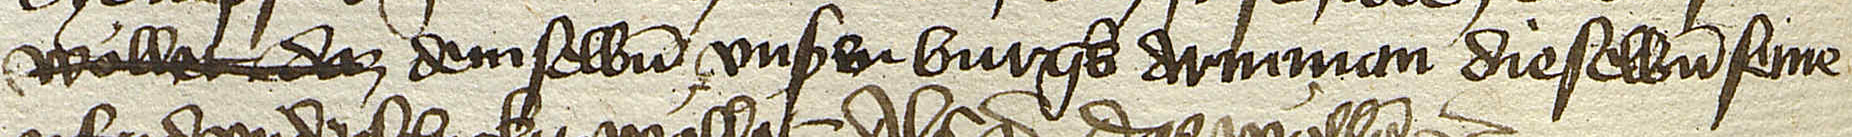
wöllet / daʒ demſelb*n vnſ*s burgs* Armman die ſelb*n ſeine
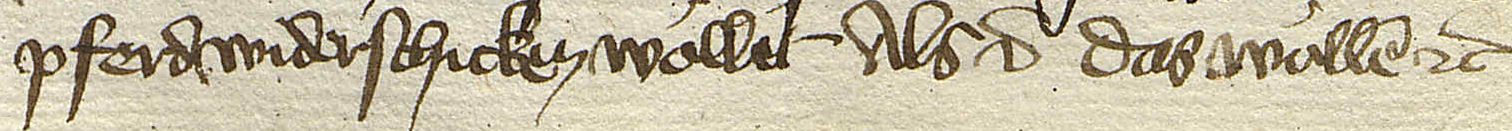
pferd widerſchicken wöllet / Als ec* das wölle* ec*
